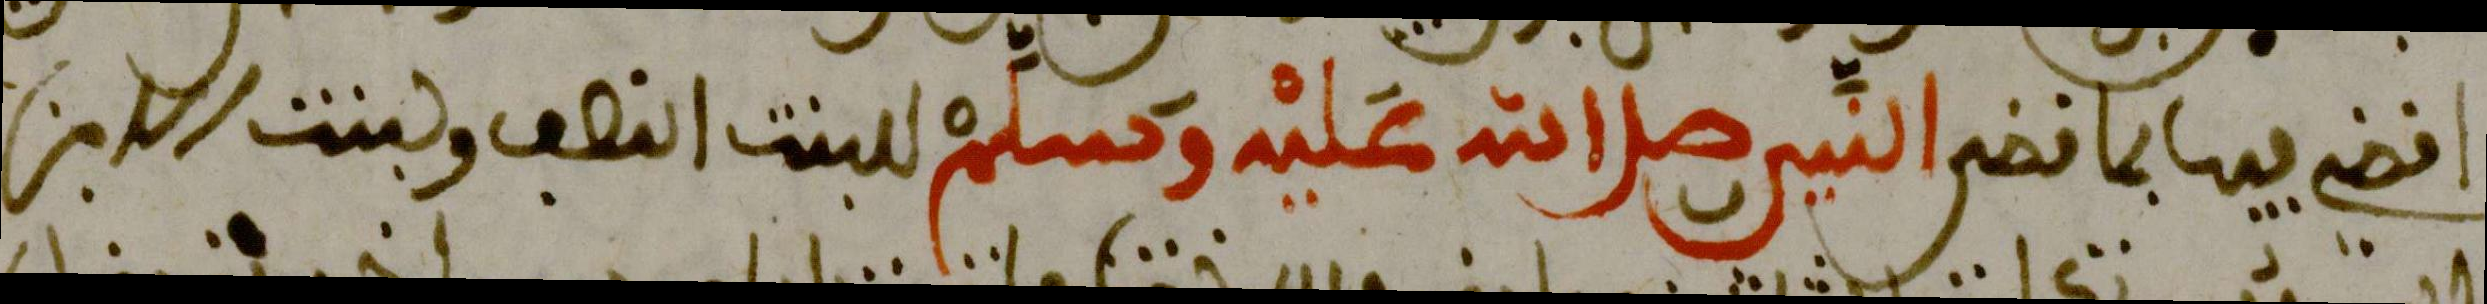اقضي فيها بما قضى النّبي صل الله عَليْه وسَلّمْ للبنت النصف ولبنت الابن
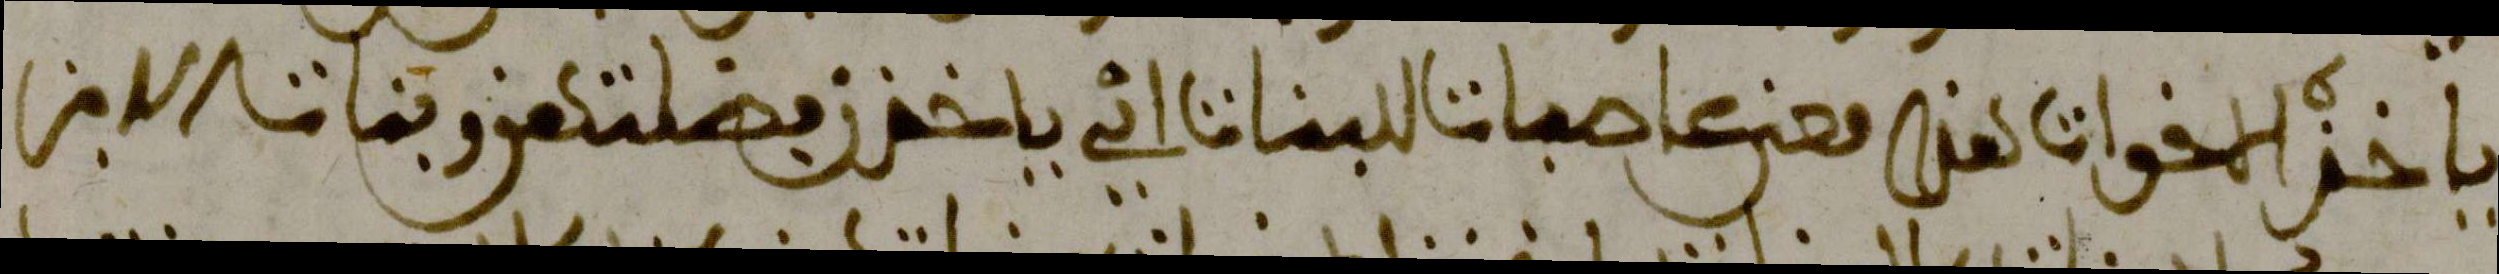يا اخذه الاخوات هذا معنى عاصبات للبنات ايْ ياخذن فضلتهن وبنات الابن
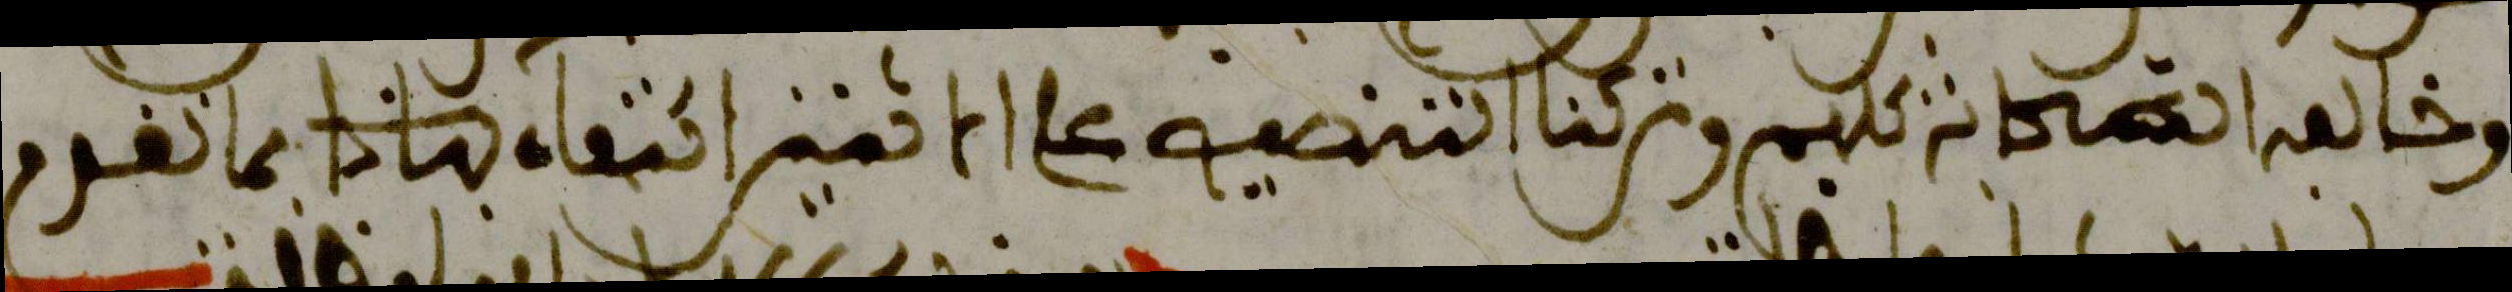وخالفه الصّحابة كلهم وتركنا التنصيص على الاثنين اكتفاء هاذا بما تقدم
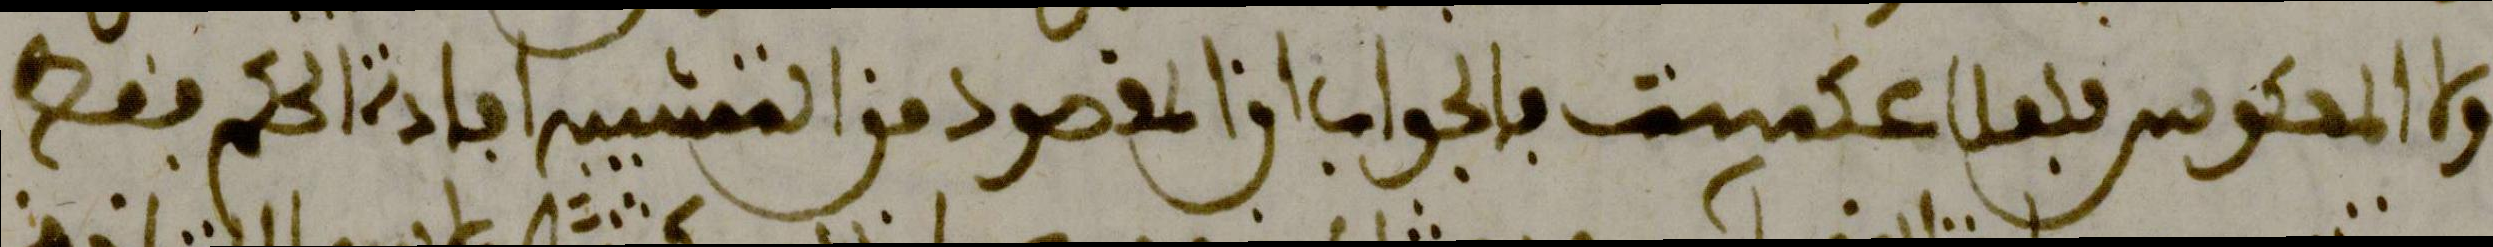ولا المعكوس فهلا عكست فالجواب ان المقصود من التشبيه افادة لحكم فقط
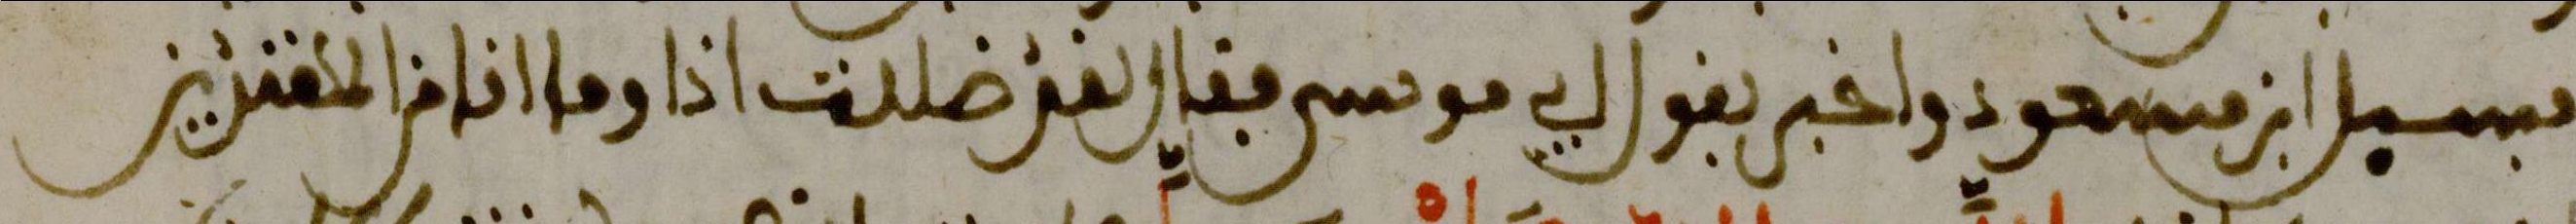فسئل ابن مسعود واخبر بقول ابي موسى فقال لقد ضللت اذا وما انا من المهتدين
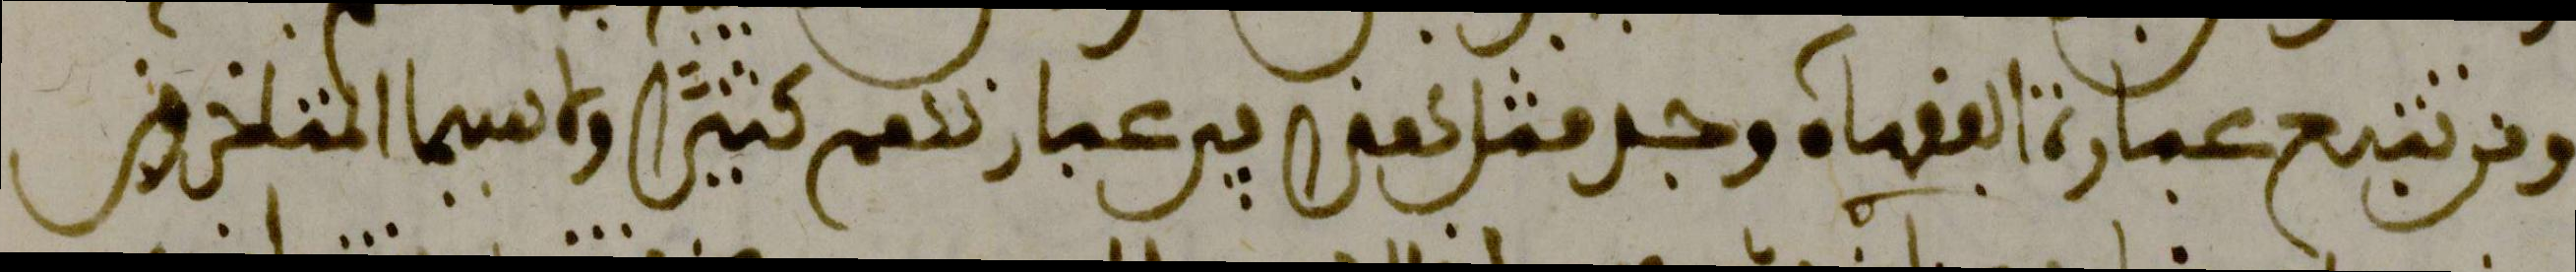ومن تتبع عبارة الفقهاء وجد مثل هذا في عبارتهم كثيراً ولا سميا المتاخرون
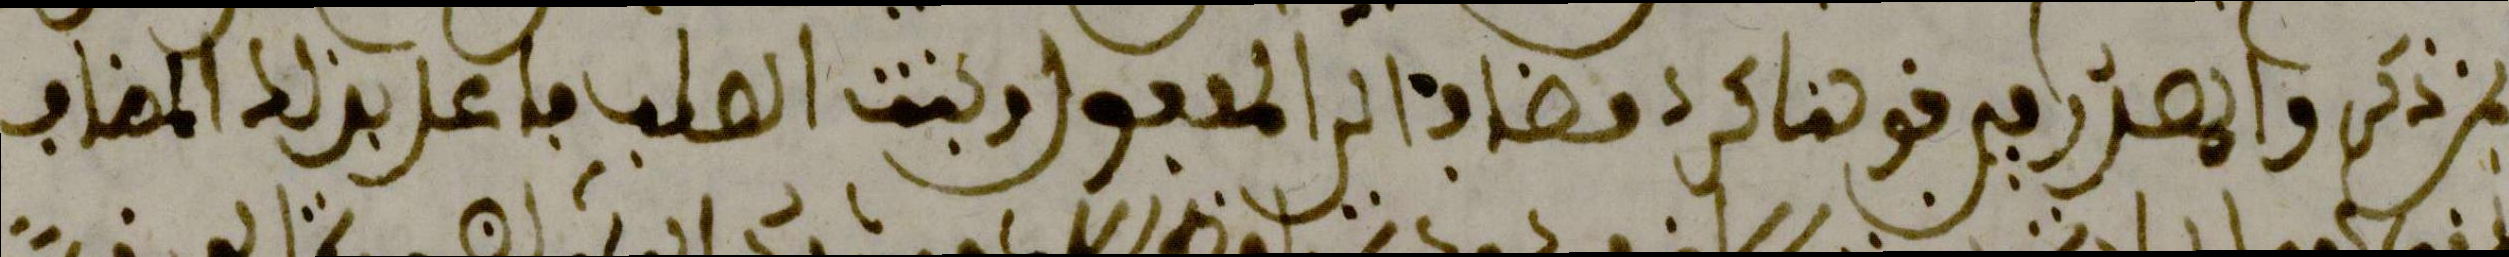بمن ذكروا لمصدر في قولنا كرد مضاف الى المفعول وبنت الصلب فاعل بذلك المضاف
